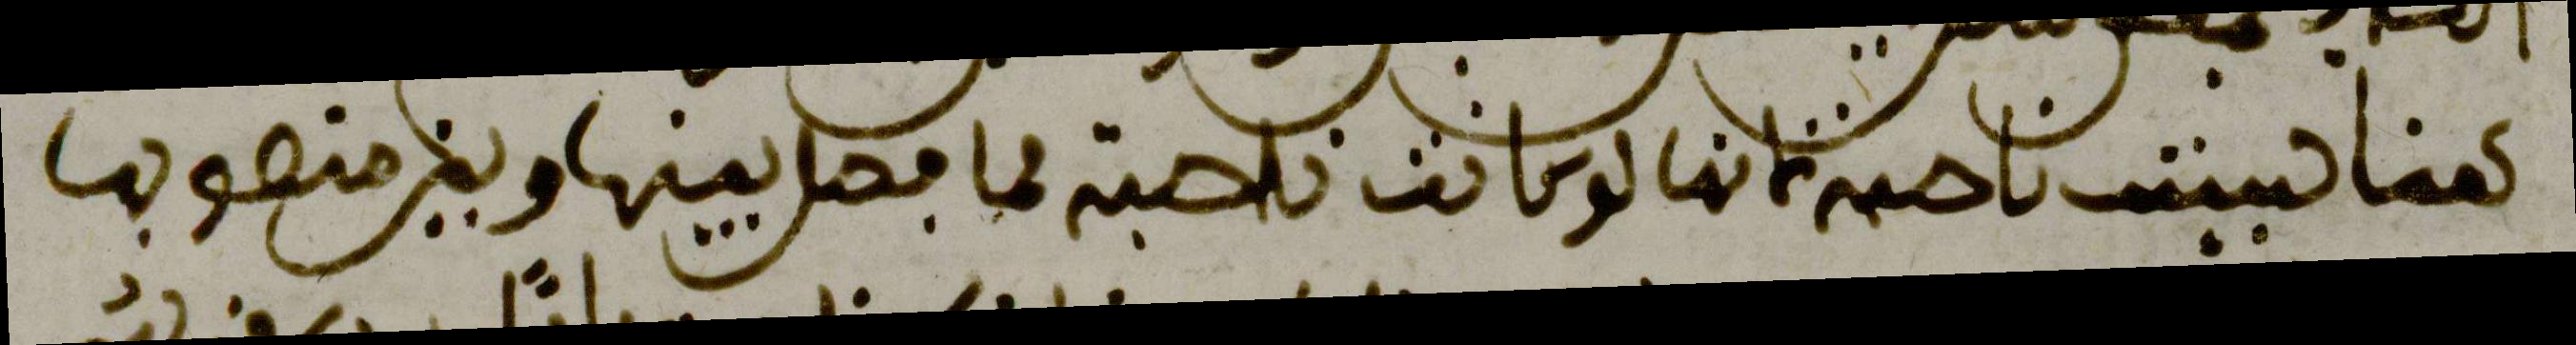هنا ليسب ناصبه لانها لوكانت ناصبة مما فصل بينها وبين منصوبها
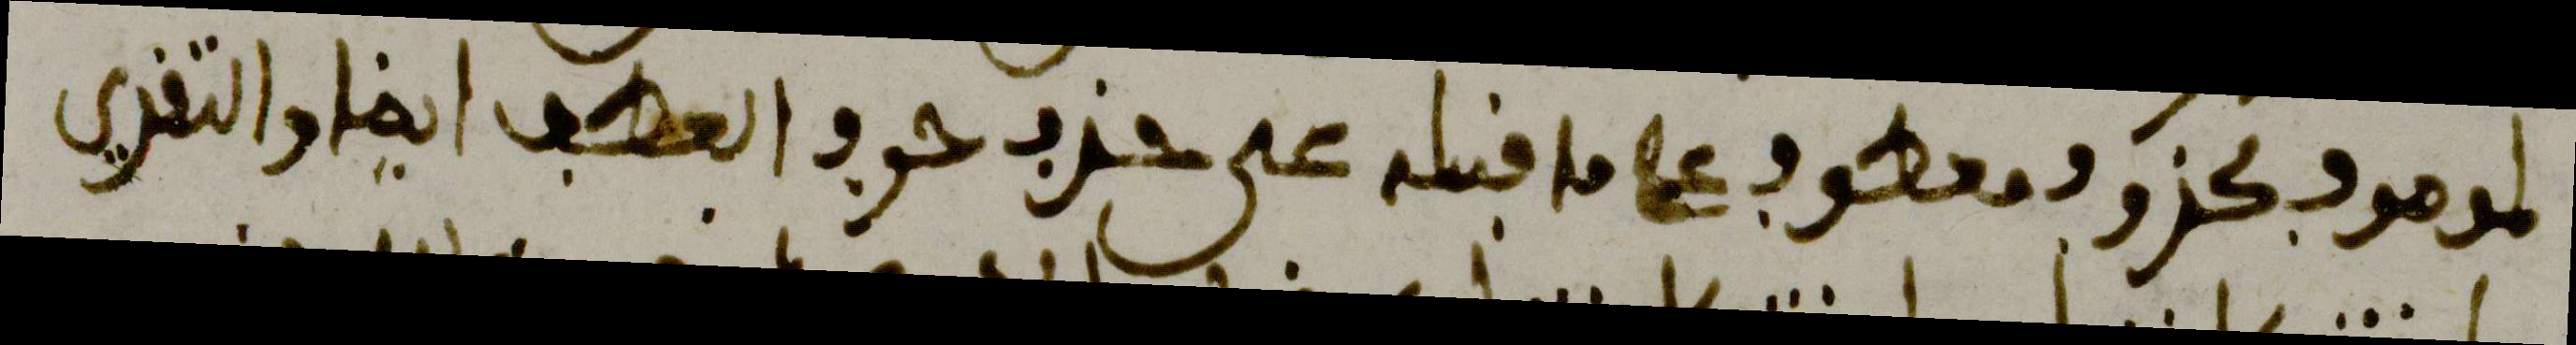لموصوف محذوف معطوف على ما قبله على حذف حوف العطف ايضا والتقدير
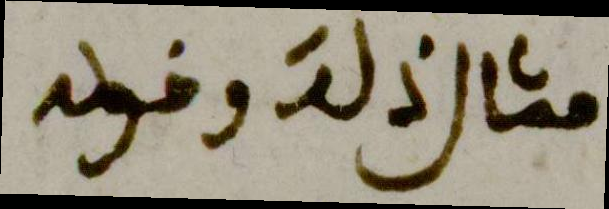مثال ذلك وقوله
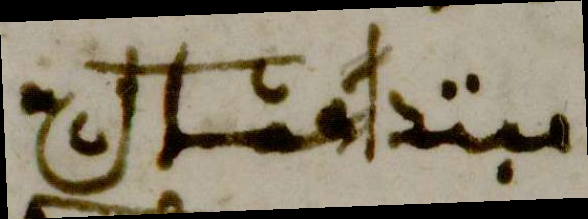مبتدا مثال
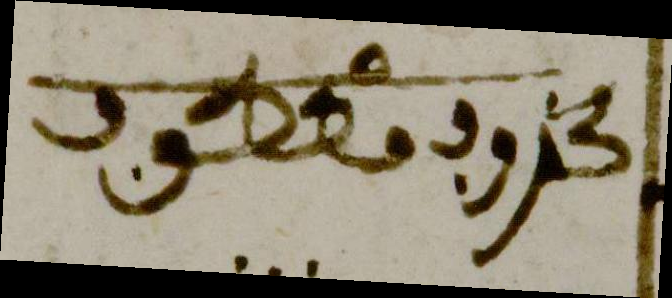محذوف معطوف
